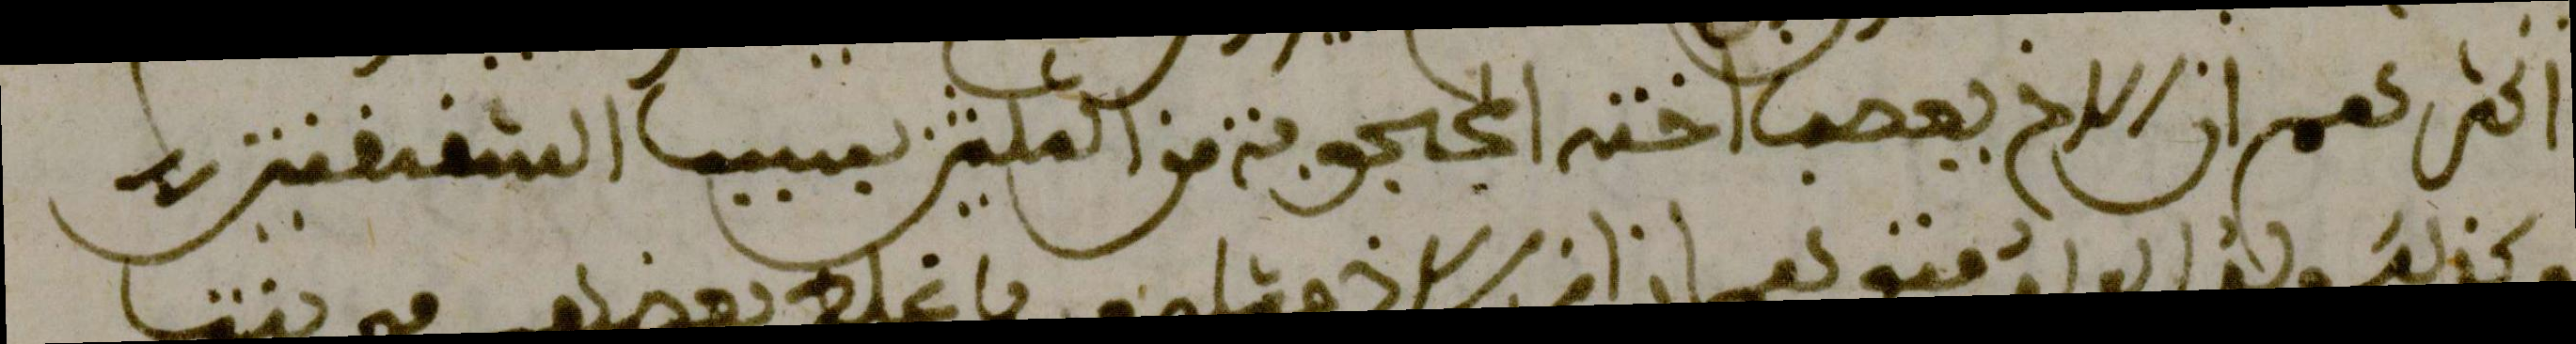اكثرهم ان الاخ يعصب اخته المحجوبة من الثلثين بسبب الشقيقين
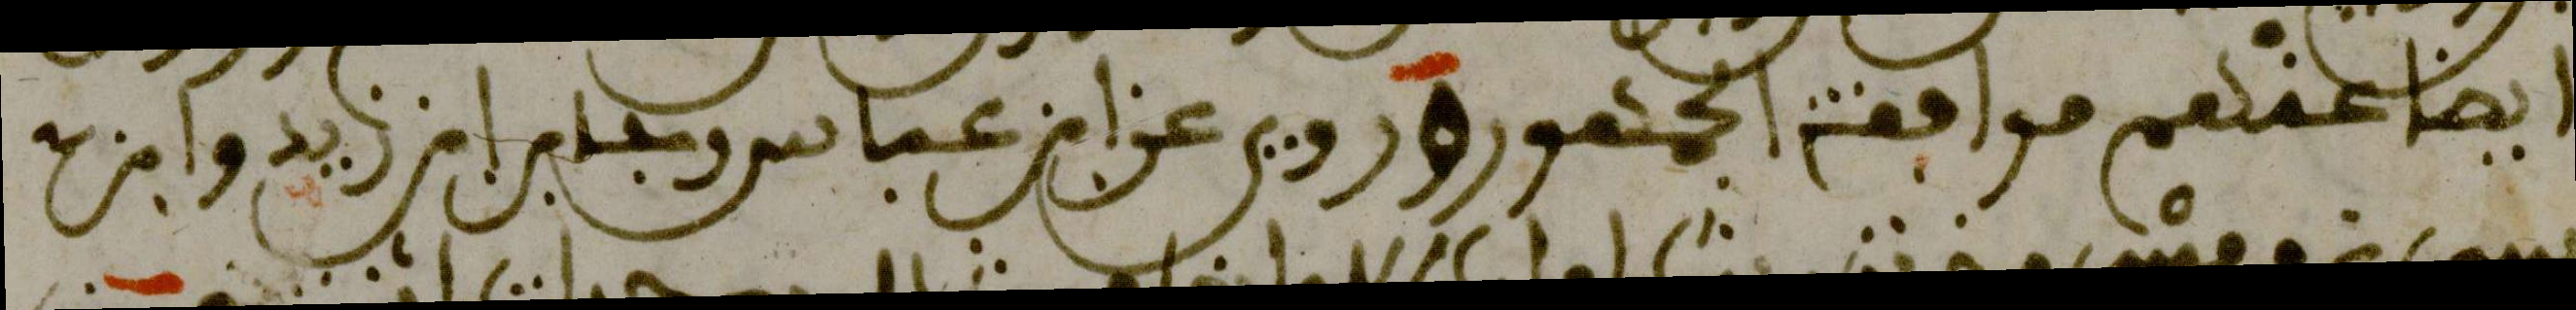ايضا عنْهم موافقة الجمهور وَروي عن ابن عباس وجابر ابن زيد وابن
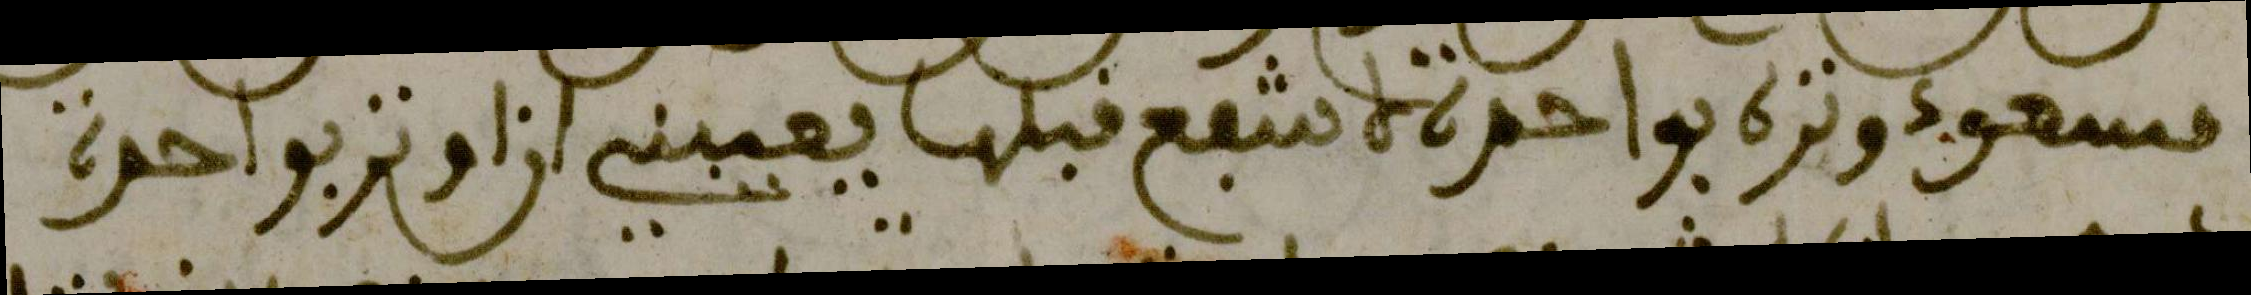مسعود وتره بواحدة لاشفع قبلها يعيبني ان اوتر بواحدة
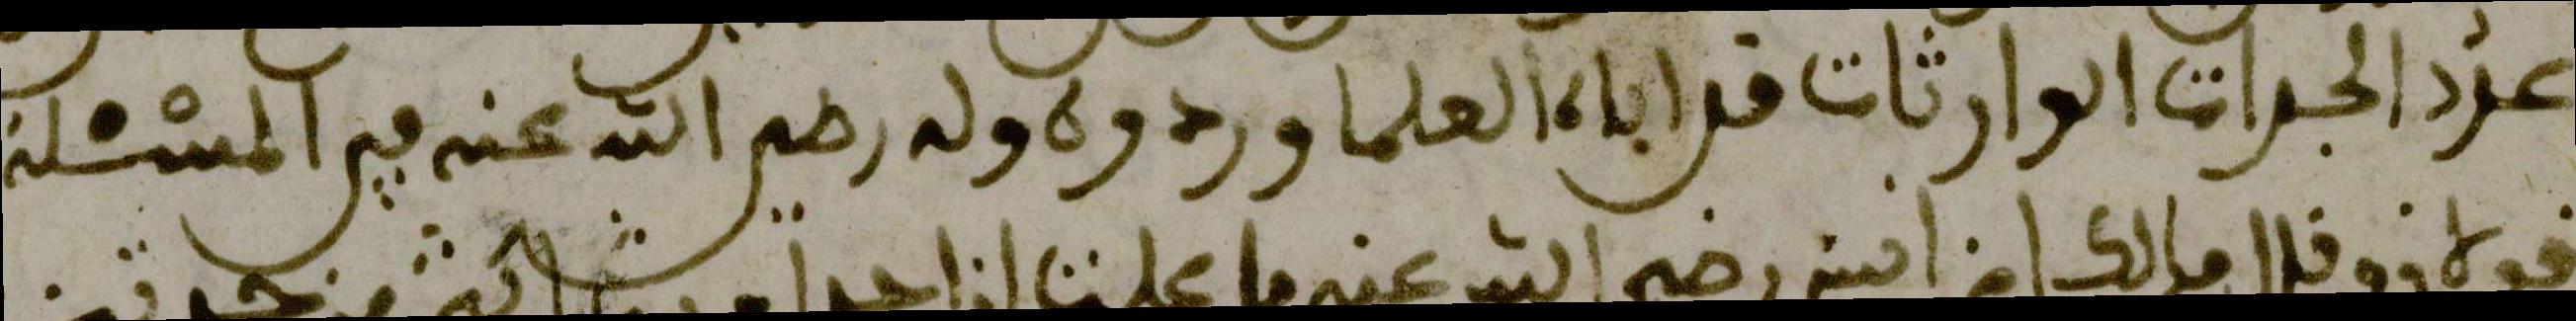عدد الجدات الوارثات قد اباه العلما وردوه وله رضي الله عنه في المسْئلة
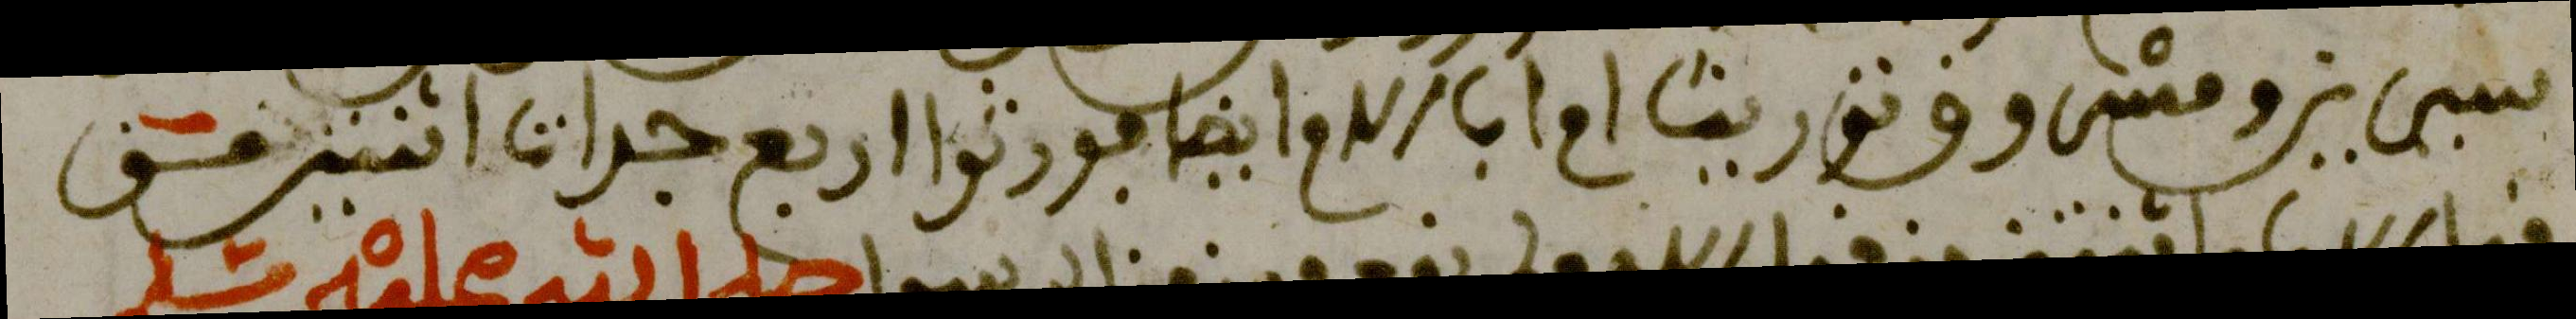سيرين ومسْروق توريت ام اب الام ايضا فورثوا اربع جدات اثنين مَن
